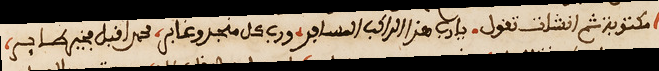مكتوبة ثم انشات تقول يا رب هذا الراكب المسافر ورب كل منجد وغابر محمد اقبل بخير طائر
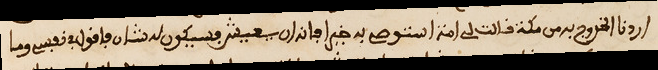اردنا الخروج به من مكة قالت لى امة استوصى به خيرا فانه ان يعيش فسيكون له شان فاقول في نفسى وما
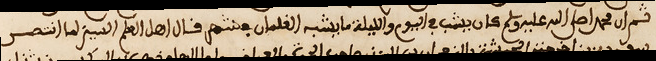ثم ان محمدا صلى الله عليه وسلم كان يشب في اليوم والليلة ما يشبه الغلمان في شهر قال اهل العلم السيز لما انتصر
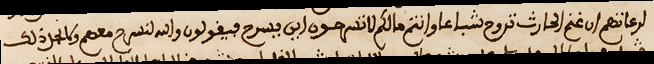لر عاتهم ان غنم الحارث تروح شباعا وانتم مالكم لا تسر حون اين يسرح فيقولون والله لنسرح معهم ولا نجد ذلك
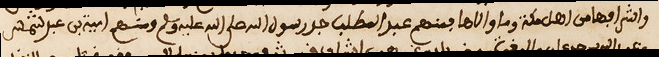واشرافها من اهل مكة وما والاها فمنهم عبد المطلب جد رسول الله صلى الله عليه وسلم ومنهم امية بن عبد شمس
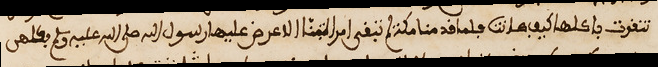نتقوت باكلها كيف هانت فلما قد منا مكة لم تبقى امرا لتبنا الاعرض عليها رسول الله صلى الله عليه وسلم فكلهن
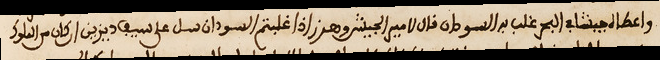واعطاه جيشا في البحر غلب به السودان قال لامير الجيش وهزر اذا غلبتم السودان سل على سيف ديزين ان كان من الملوك
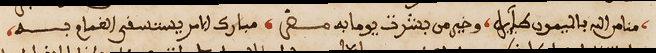منا من الله باليمون ط### وخير من بشرت يوما به مضى مبارك الامر يستسقى الغمام به
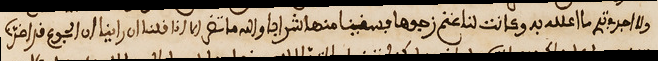ولا اجد في تدي ما اعلله به وكانت لنا غنم زجوها فسقينا منها شرابا والله ما تضر الا اذا قلنا ان راينا ان الجوع قد اضرت
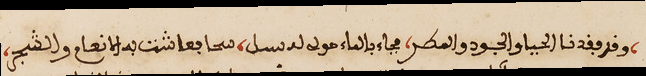وقد فقدنا الحيا والجود والمطر فجاء بالماء حولى له سمل سحا فعاشت به الانعام والشجر
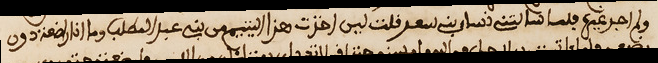ولم اجد غيره فلما سالتنى نساء بنى سعد قلت لين اخذت هذا اليتيم من بنى عبد المطلب وما اذا راضعة دون
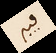فيه
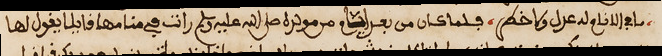ما في الانام له عدل ولا خطر فلما كان من بعد ايام من مولده صلى الله عليه وسلم رات في منا مها قايلا يقول لها
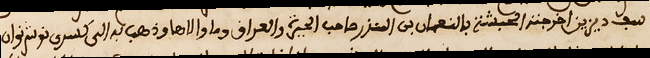سف ديزين اخرجته الحبشة بالنعمان بن المنذر صاحب الحيرة والعراق وما والاها وذهب به الى كسرى نوشرنوان
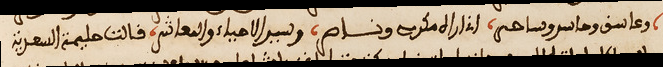وعاسق وحاسد وساحر اني اراه مكرمى وناصر وسيد الاحياء والمعاشر قالت حليمة السعدية
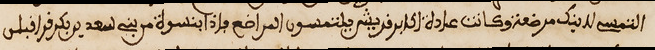التمسى لابنك مرضعة وكانت عادة اكابر قريش يلتمسون المراضع فاذا بنسوة من بنى سعد بن بكر قد اقبلن
